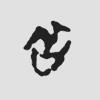向
